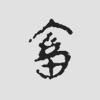畜
